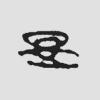是
